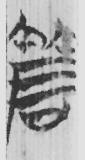{竹石}
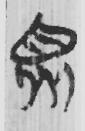眾
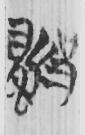{於鳥}（烏）
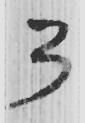乃
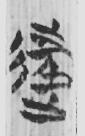{辶之𡈼}
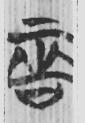{巫口}
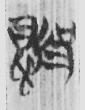{於鳥}（烏）
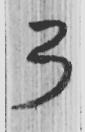乃
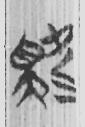{目大欠}
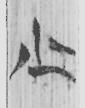少
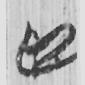臣
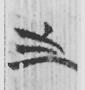之
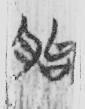朐
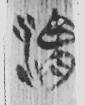渭
